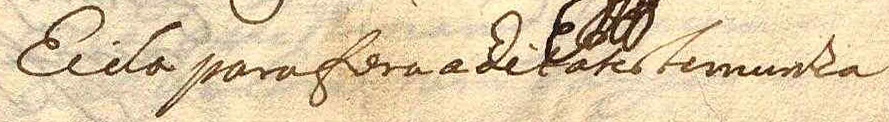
E ida para fora a dita testemunha
